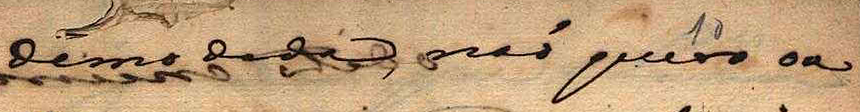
demodada, naõ quero ou
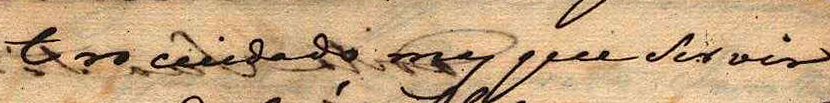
tro cuidado, mas que servir
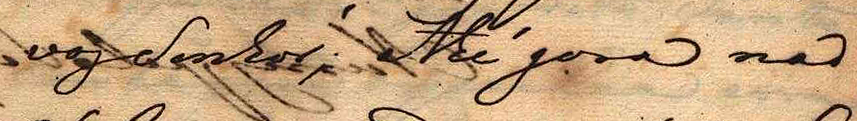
vos Senhor, athé gora naõ
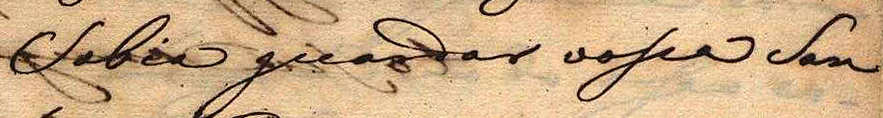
Sabia guardar vossa San
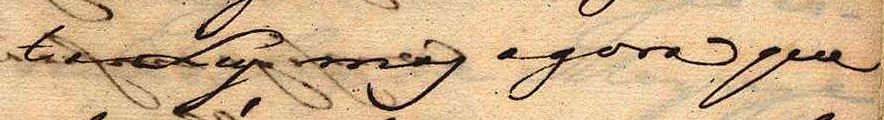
ta Ley mas agora que
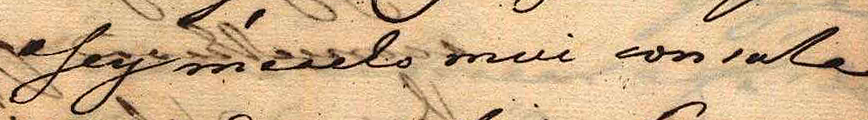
a sey me acho mui consula
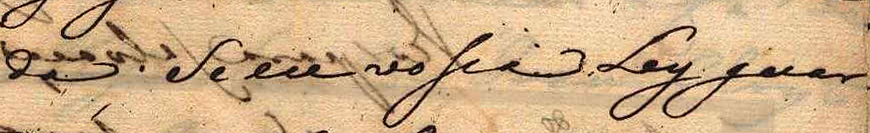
da; se eu vossa Ley guar
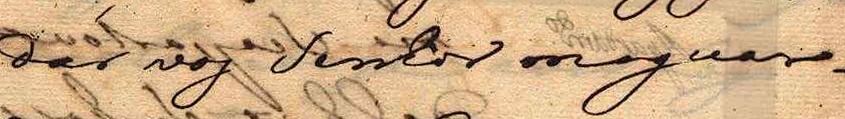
dar vos Senhor me guar
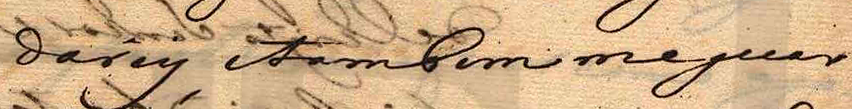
darey e tambem me guar
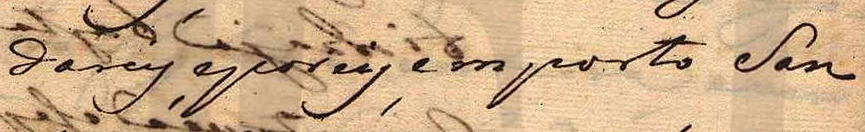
darey, e porey em porto San
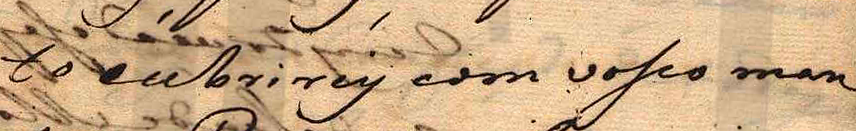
to cubrirey com vosso man
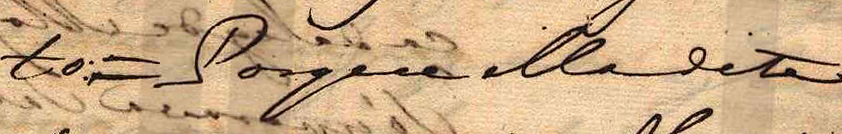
to = Porque ella dita
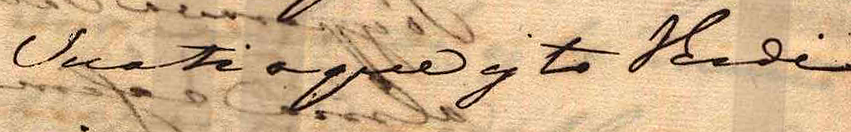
sua tia que isto lhe de
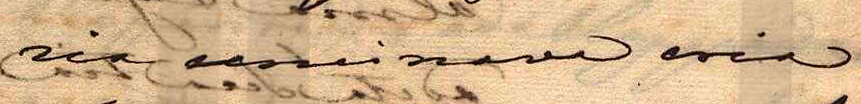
zia a ensinava cria
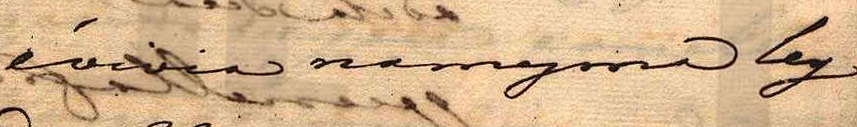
e vivia na mesma ley
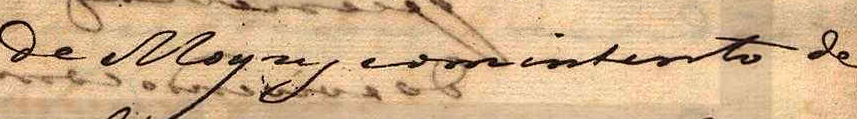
de Moyzes com intento de
